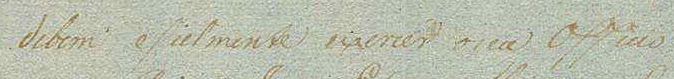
de bem e fielmente exercer o seu Officio
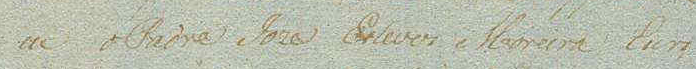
eu o Padre Ioze Esteves Moreira Escri
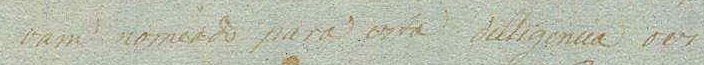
vam nomeado para esta delligencia o es
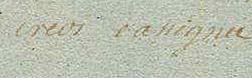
crevi e assignei
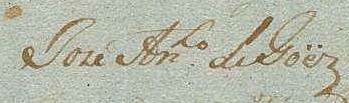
Ioze An.to de Goēz
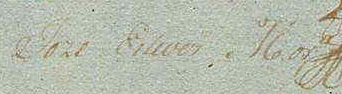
Ioze Estevez Mor.a
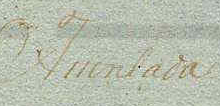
Assentada
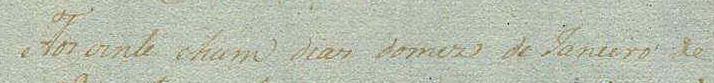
Aos vinte e hum dias do mez de Ianeiro de
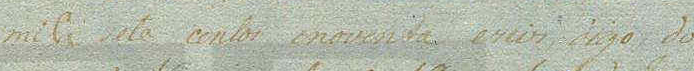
mil setecentos e noventa e seis digo do
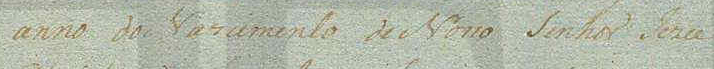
anno do Nascimento de Nosso Senhor Iezu
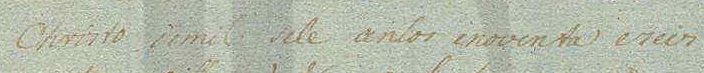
Christo de mil setecentos e noventa e seis
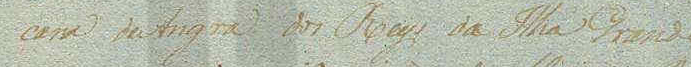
çam de Angra dos Reys da Ilha Grande
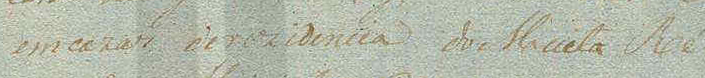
em cazaz de rezidencia do Muito Re
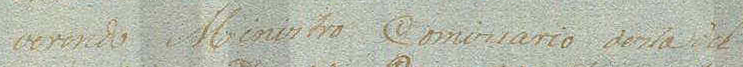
verendo Ministro Comissario desta del
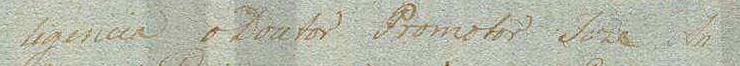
ligencia o Doutor Promotor Ioze An
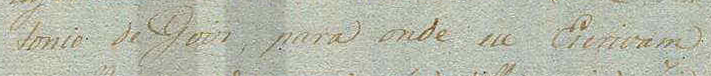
tonio de Goiz, para onde eu Escrivam
